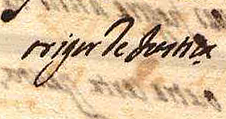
o rigor de Iustiça
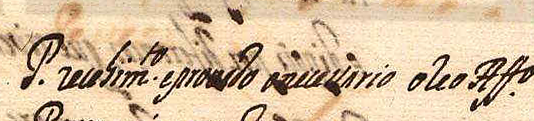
P. recebim.to e provado o necessario o Reo Aff.o
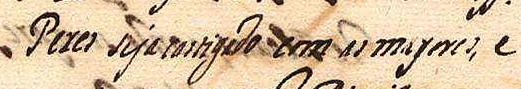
Peres seja castigado com as mayores, e
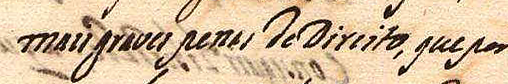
mais graves penas de Direito, que por
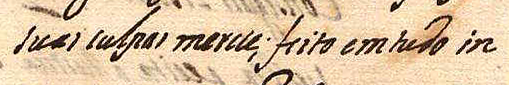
suas culpas merece; feito em tudo in
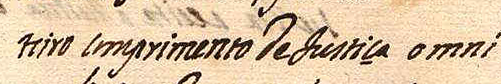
teiro comprimento de Iustiça omni
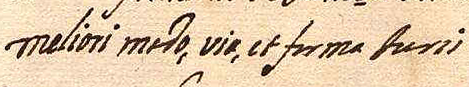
meliori modo, via, et forma Iuris
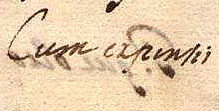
Cum expensis
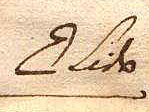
E lido
